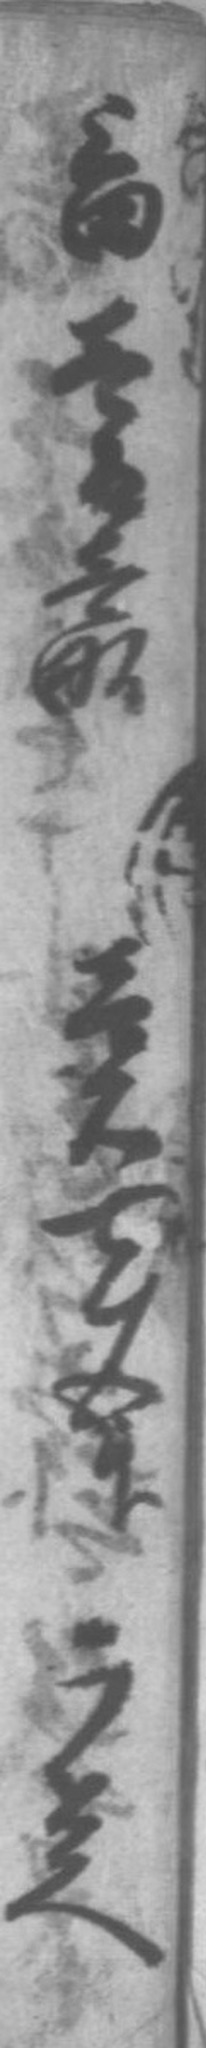上田壱反壱畝壱石七斗五升二郎兵衛
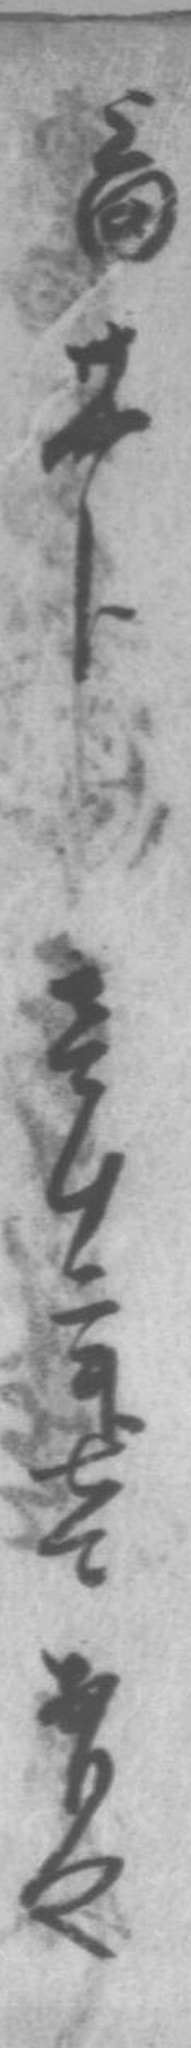上田廿一分壱斗二升七合おりや
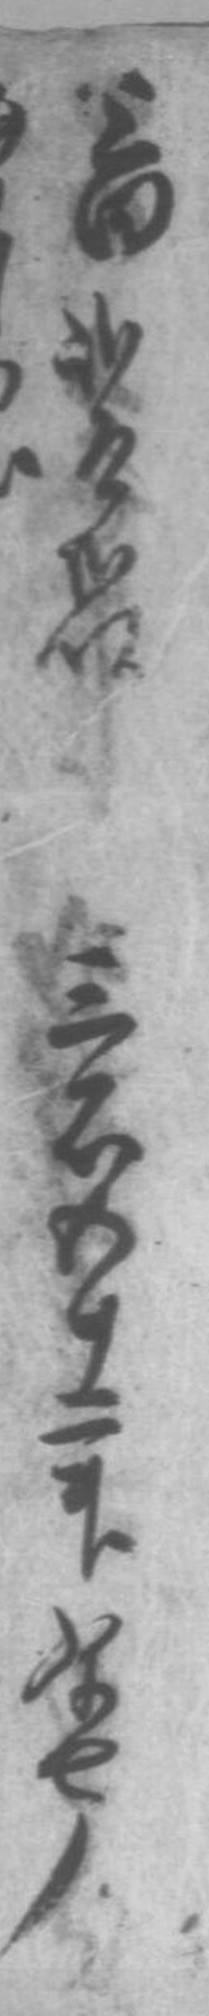上田弐反弐畝三石五斗二升弥七郎
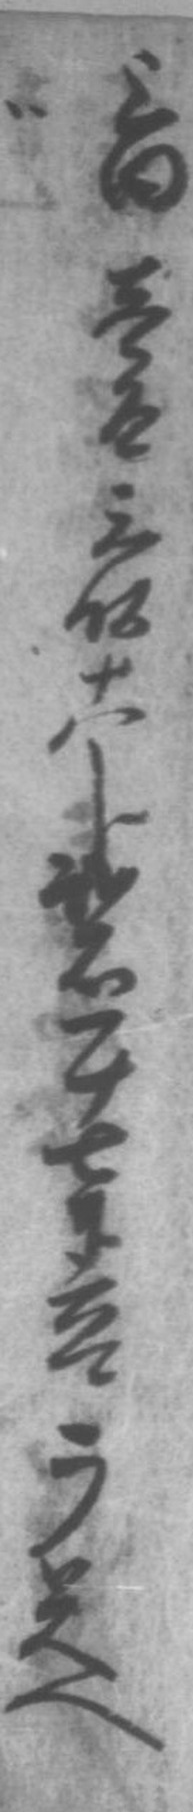上田壱反三畝十八分弐石一斗七升六合二郎兵衛
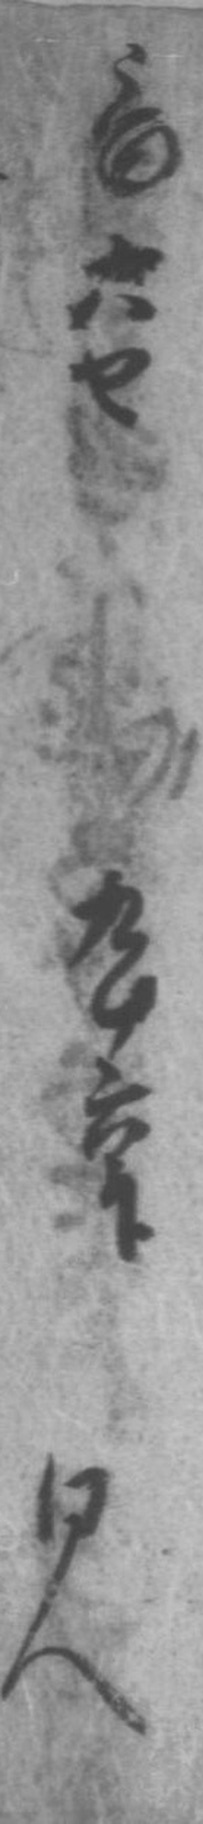上田六畝九斗六升同人

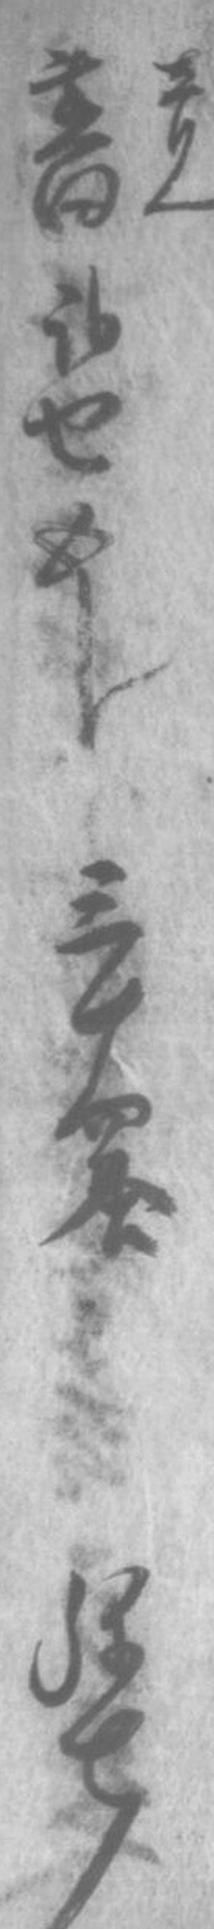荒田二せ五分三斗四合弥七郎
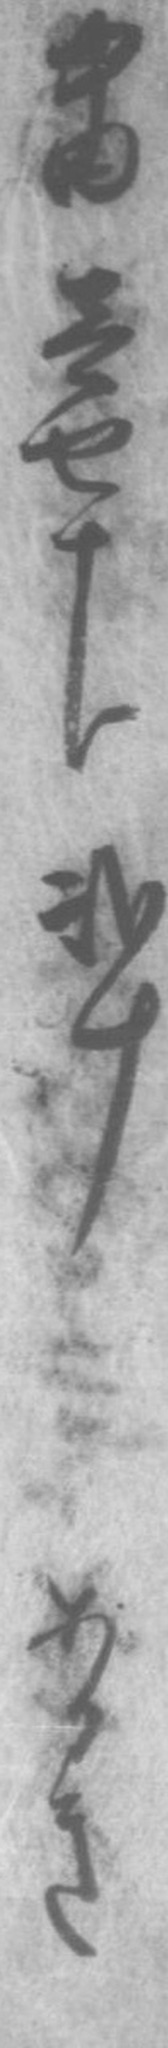中田壱せ十分弐斗あかき
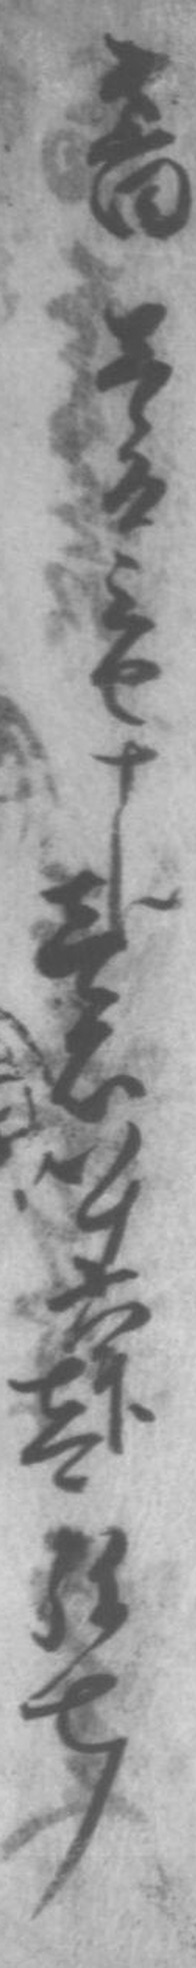荒田壱反三せ十分壱石八斗六升七合弥七郎
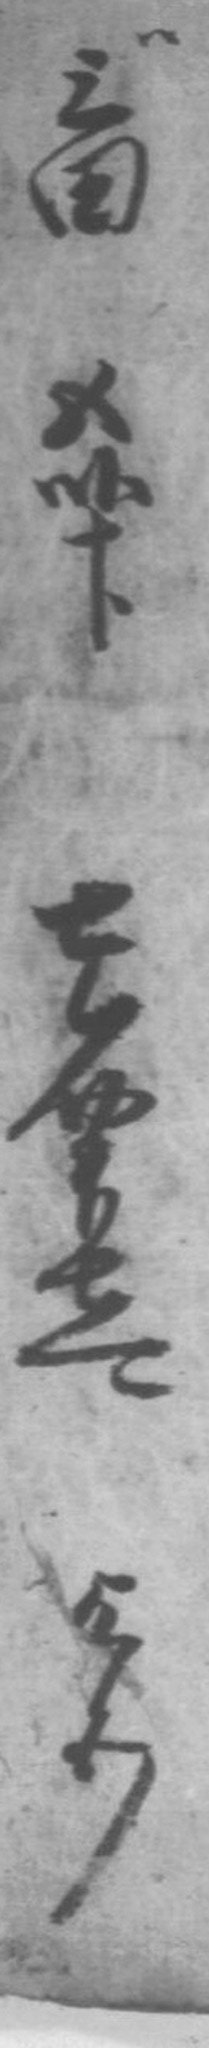上田五畝十分七斗四升七合与五郎
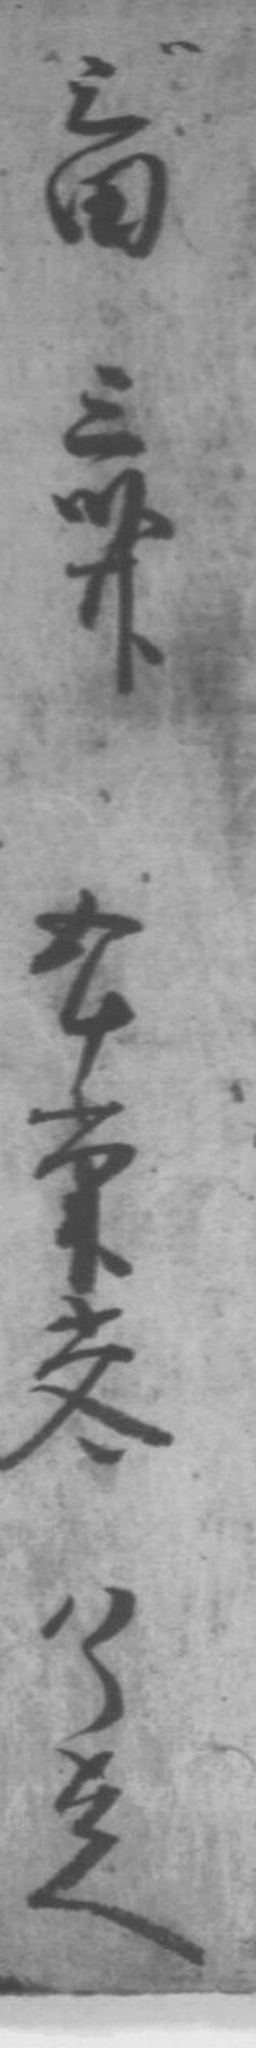上田三畝廿分五斗六升六合八郎兵衛
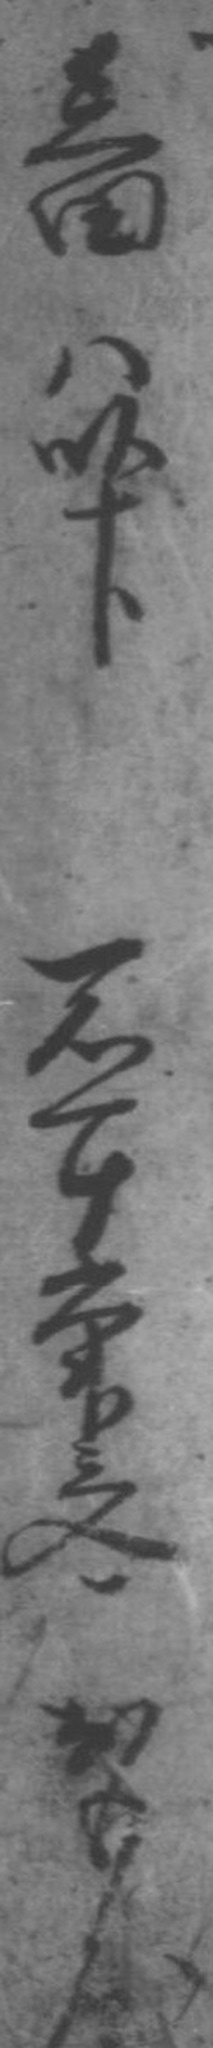上田八畝十分一石一斗六升三合おりや

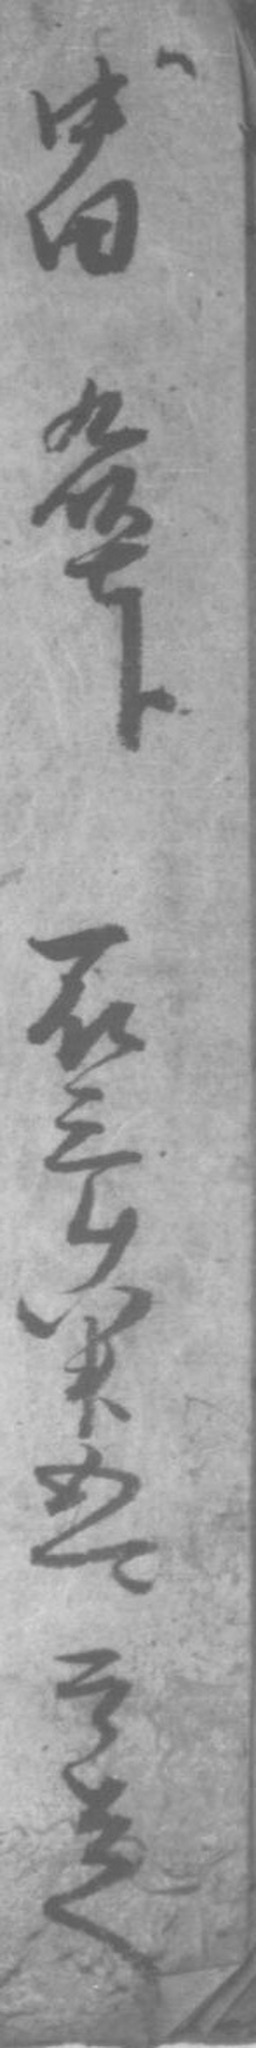中田九畝七分一石三斗八升五合二郎兵衛
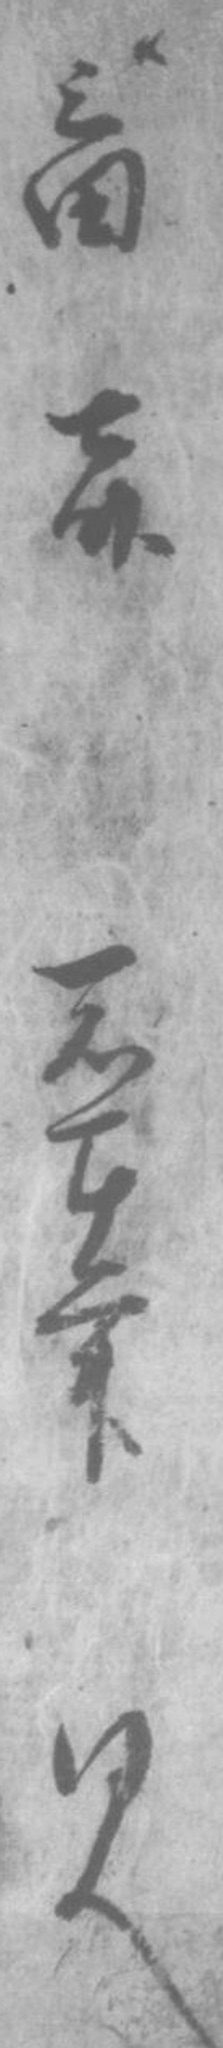上田七畝一石一斗二升同人
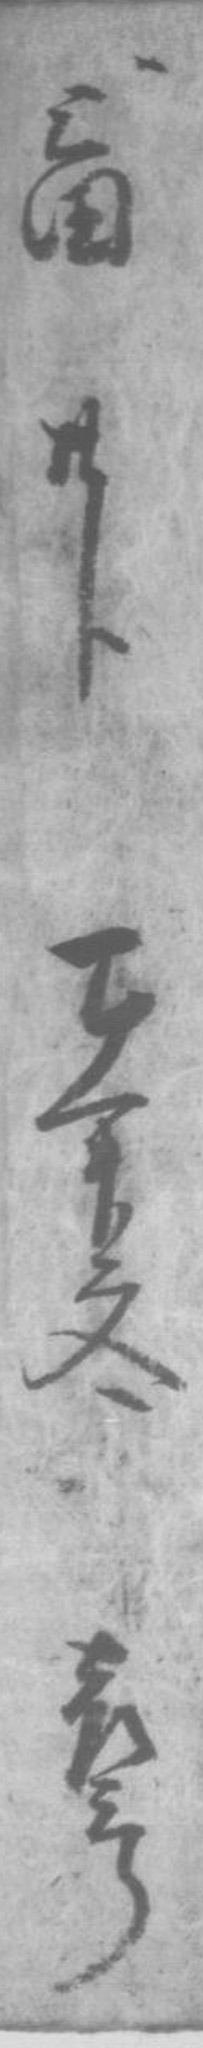上田廿分一斗一升二合彦三郎
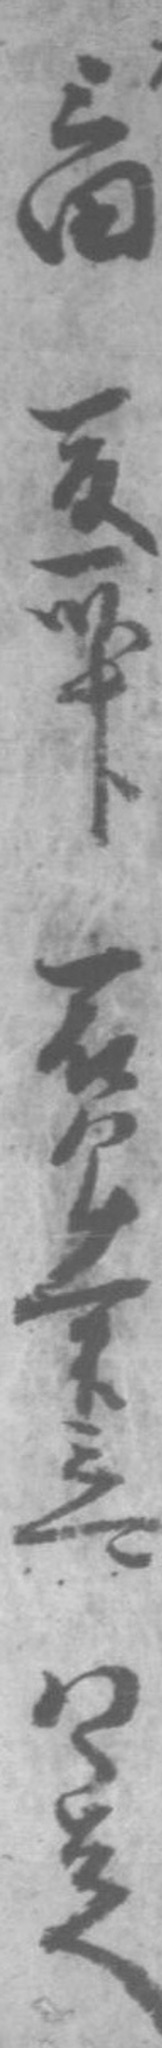上田一反一畝十分一石八斗一升三合八郎兵衛
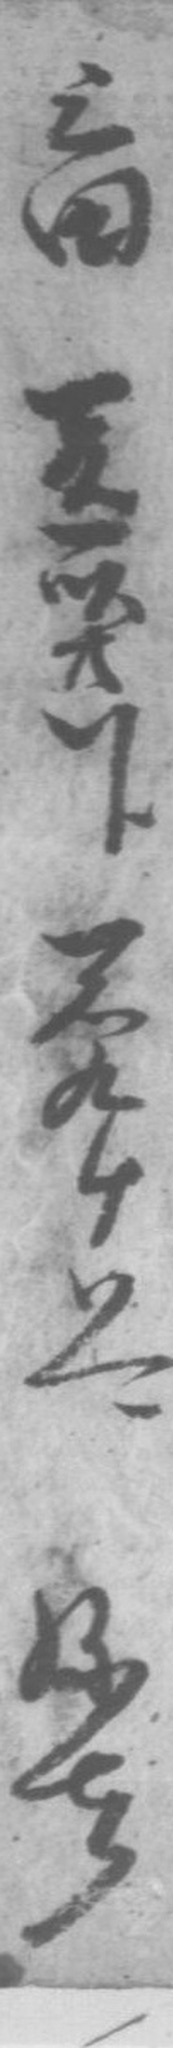上田一反一畝廿八分一石九斗八合弥七郎
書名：越州大野郡ノ内不動堂村御検地帳
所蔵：福井県文書館 Fukui Prefectural Archives
